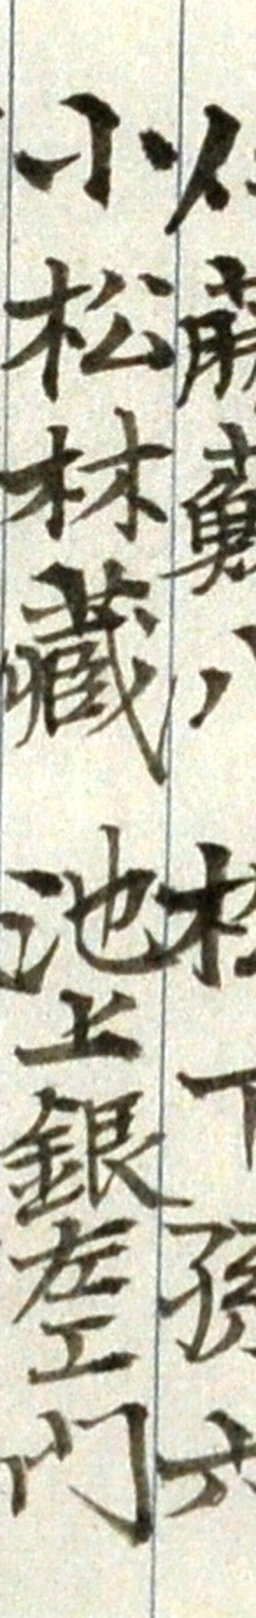小松林蔵池上銀左衛門
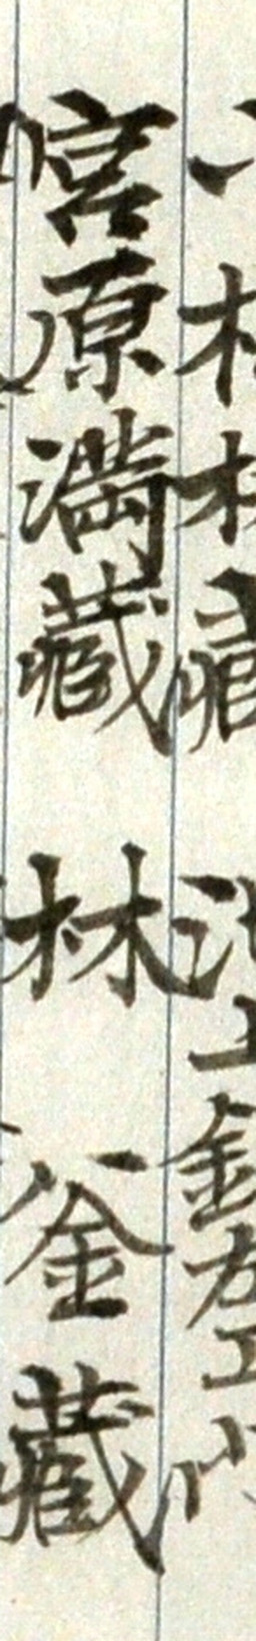宮原満蔵林釜蔵
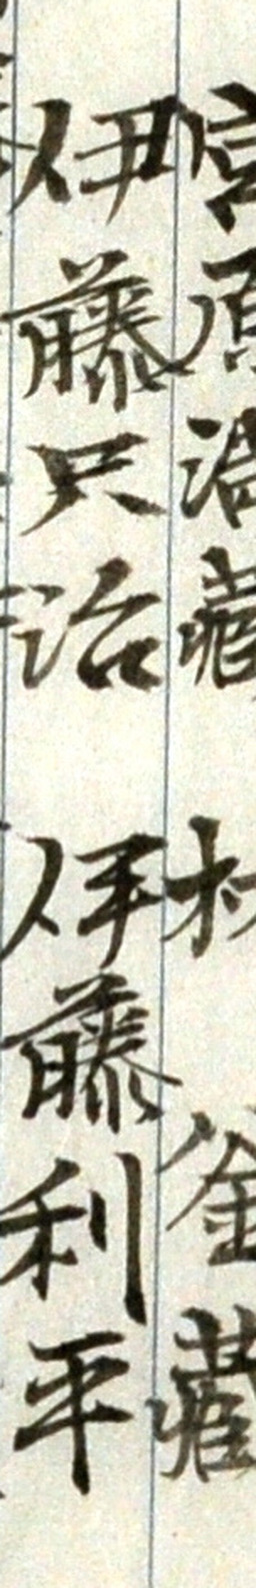伊藤只治伊藤利平
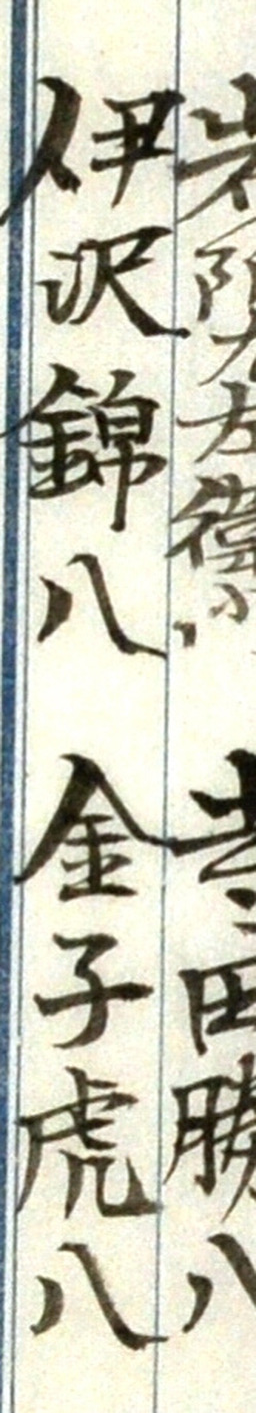伊沢錦八金子虎八
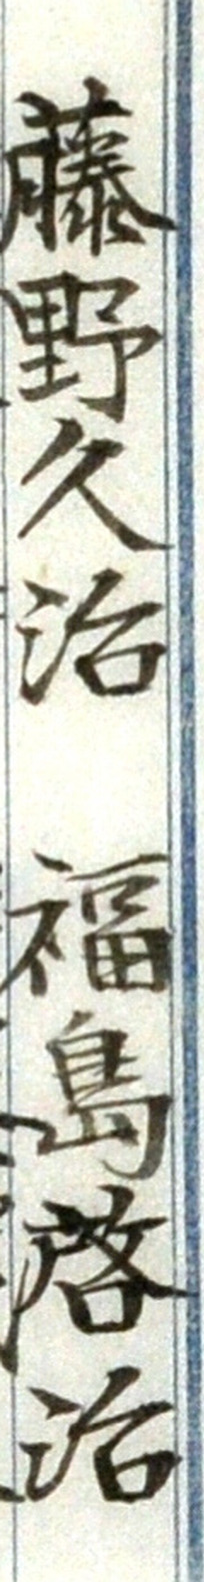藤野久治福島啓治
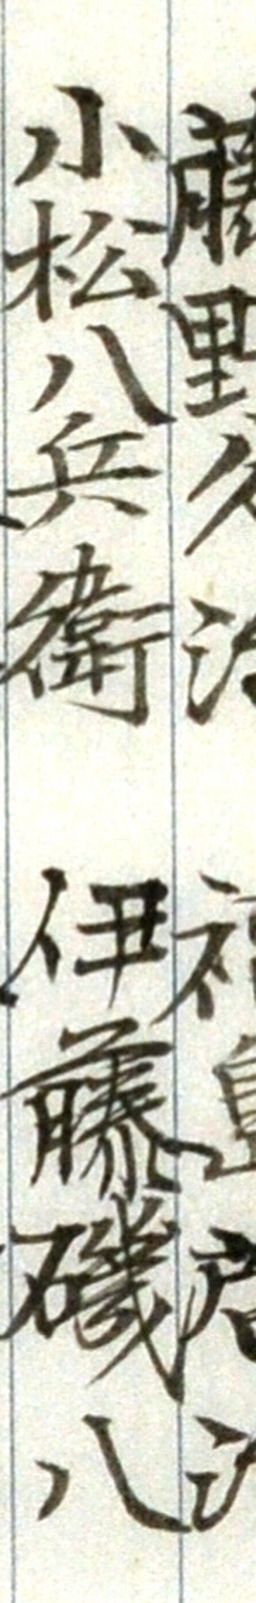小松八兵衛伊藤磯八
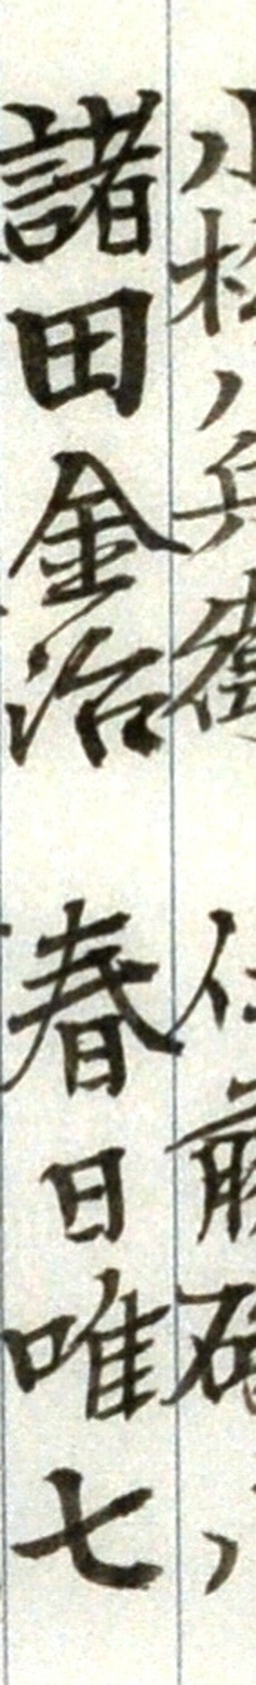諸田金治春日唯七
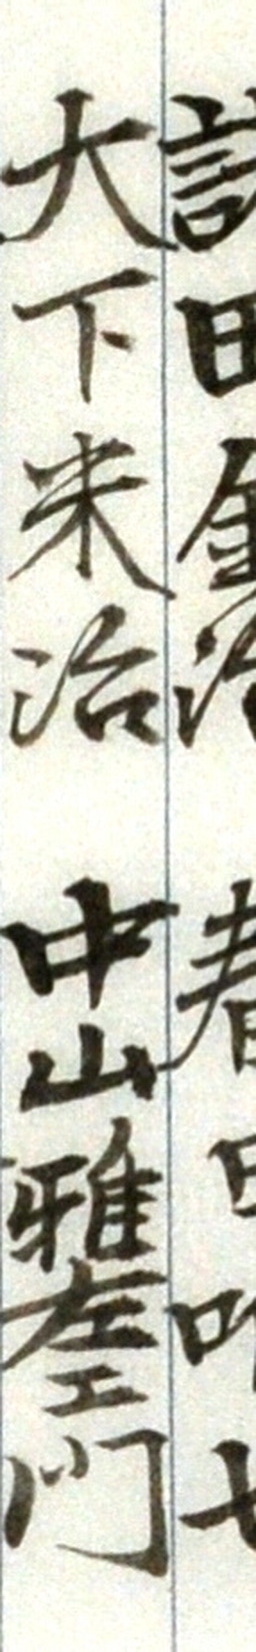大下米治中山雅左衛門
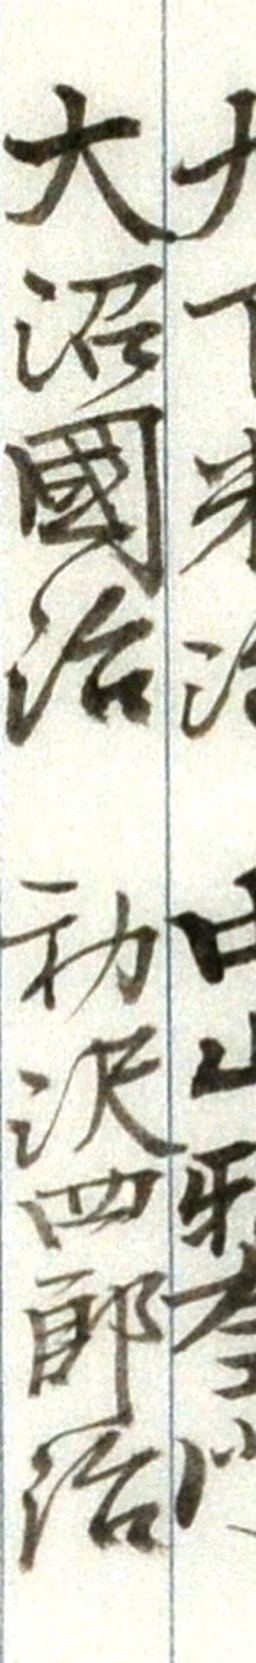大沼国治初沢四郎治
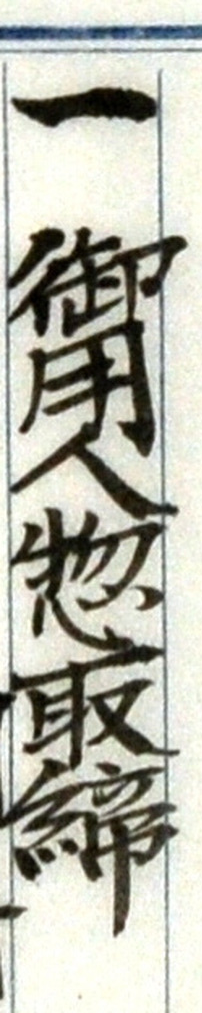一御用人惣取締
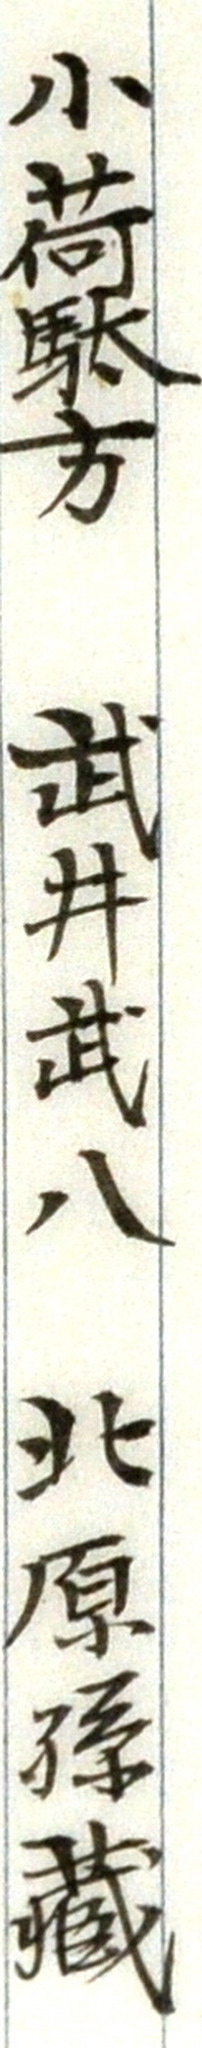小荷駄方武井武八北原孫三

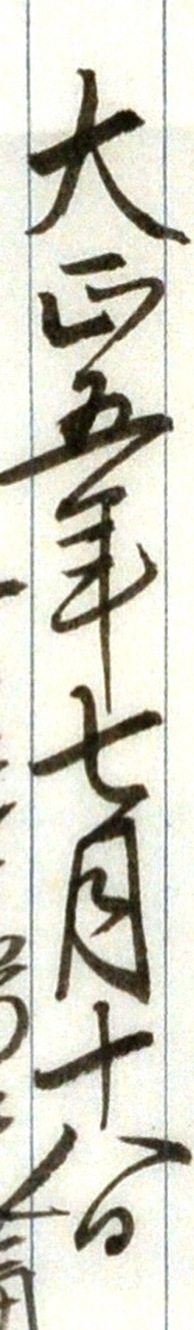大正五年七月十八日
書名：生麦事件ニ付動員
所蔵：伊那市立高遠町図書館・合同会社AMANE
